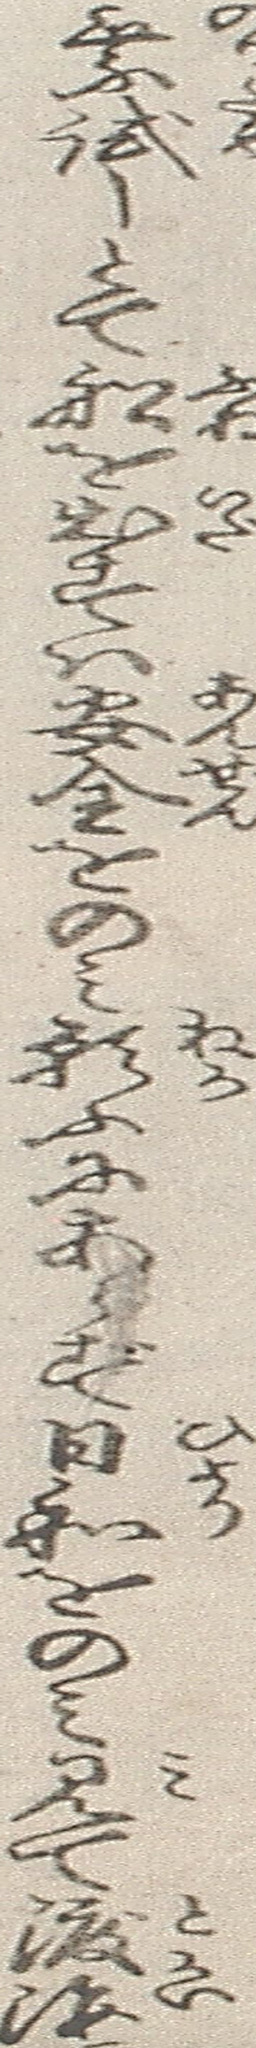乗試しとて船を出すハ安全をのミ願ふにあらず日和をのミ見て渡海
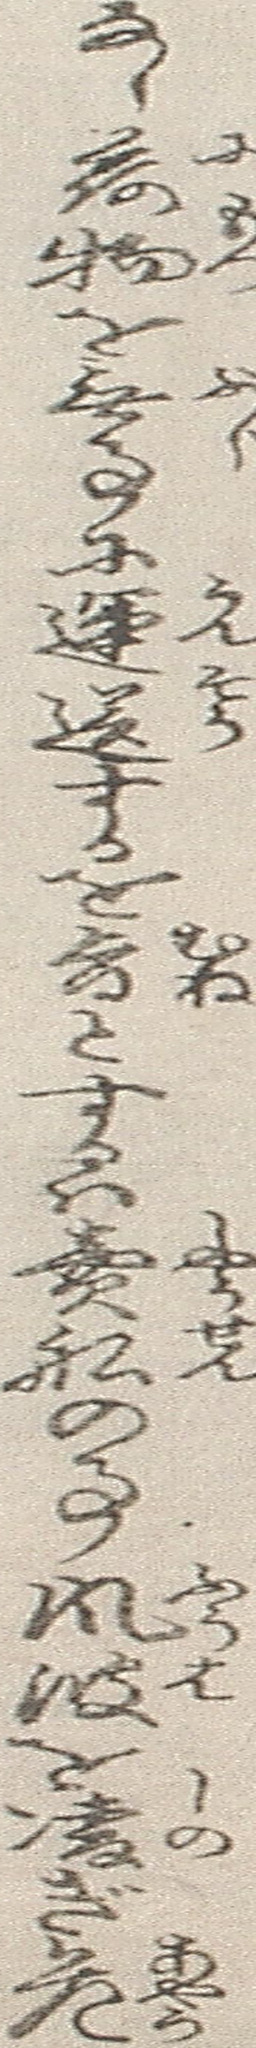なし荷物を無事に運送するを旨とするハ商船の事風波を凌ぎ危
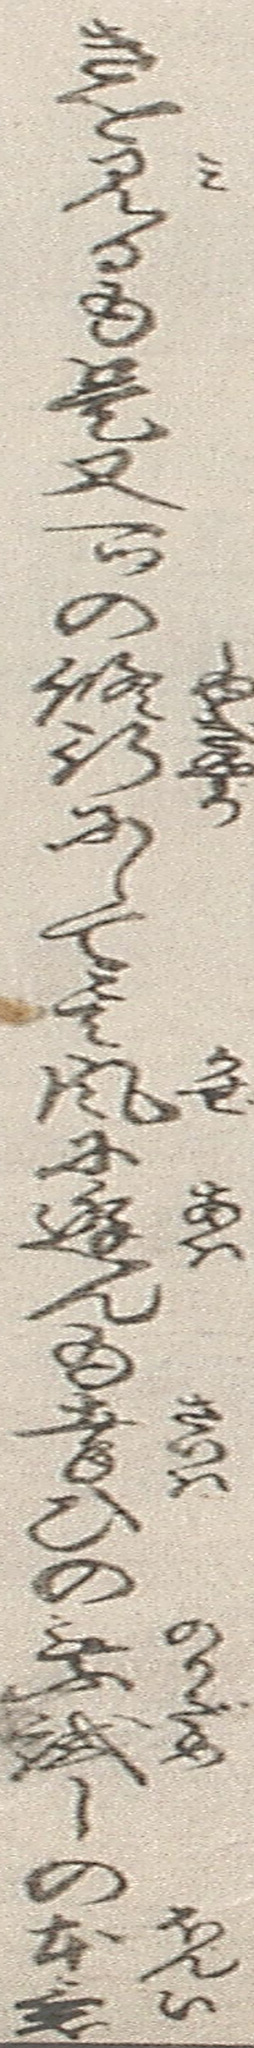きを見るも是又一ッの修行にしてこそ風に逢んも幸ひの乗試しの本意
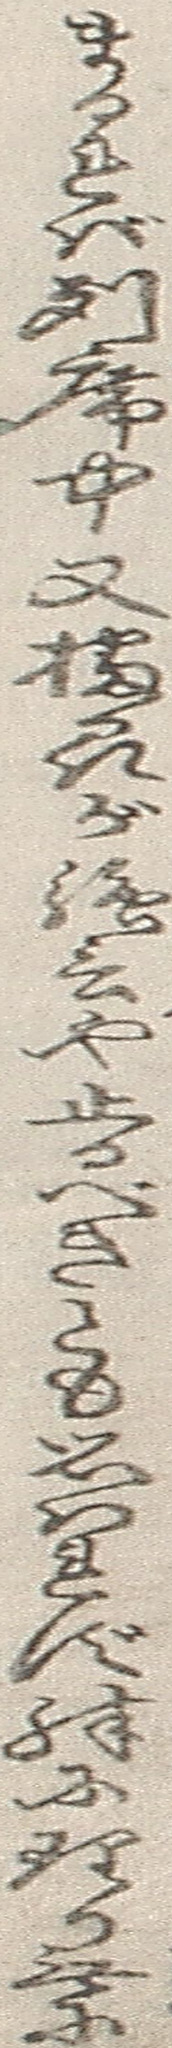まるれバ列席中又播州が強言や止るべきとも思ハれず殊に理り無に
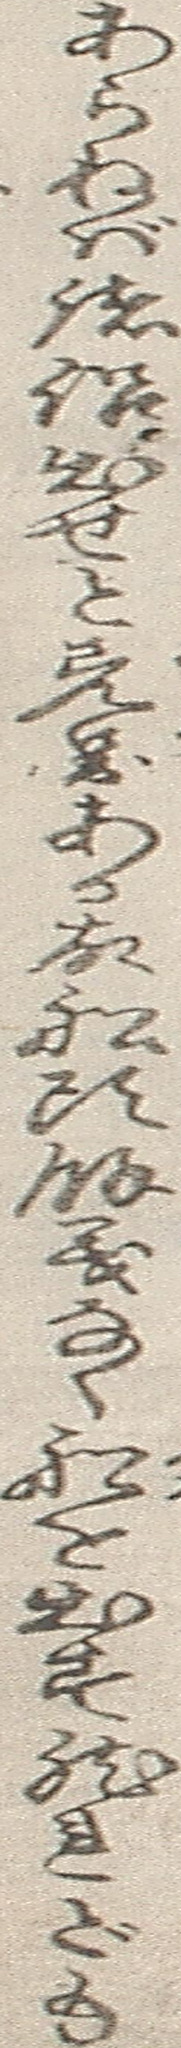あらねバ諸侶出せと差図ある故船頭餘義なく船を出す然れども
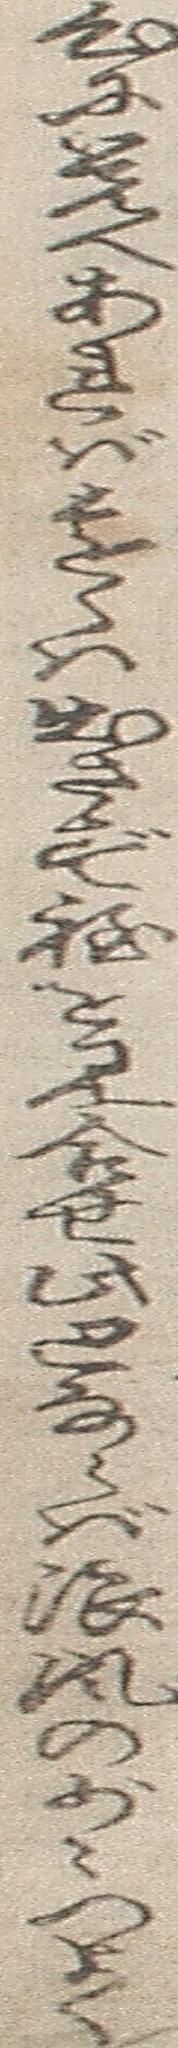心に覚へあれバ遠くハ出さず程を見合せ此辺ならバ浪風の少々つよく

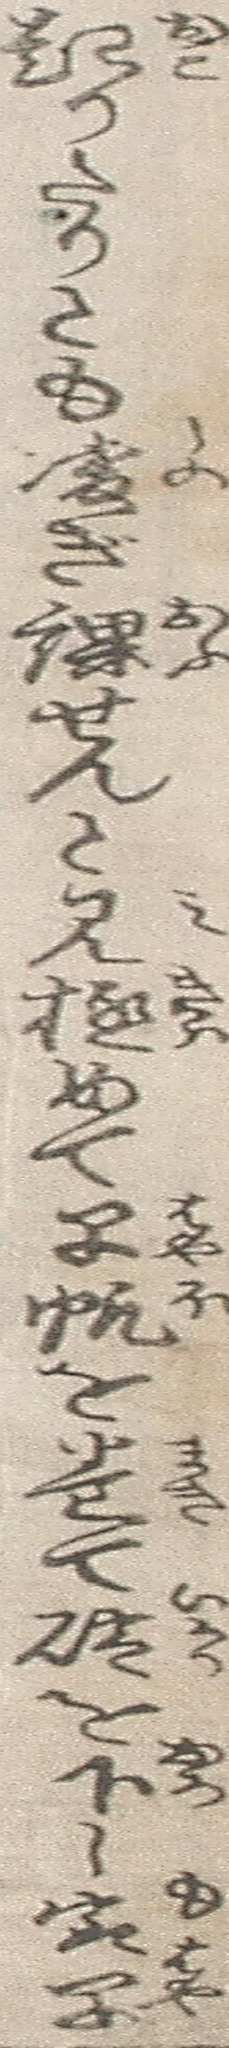起りたりとも凌ぎ課せんと見極めて早帆を巻て碇を下し最早
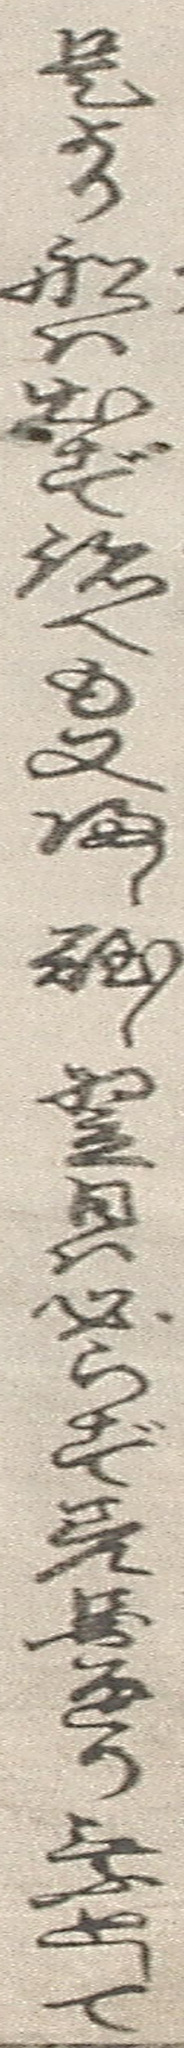是より船ハ出ず跡へも又帰し難し翌日ハ必らず差図通り乗廻て
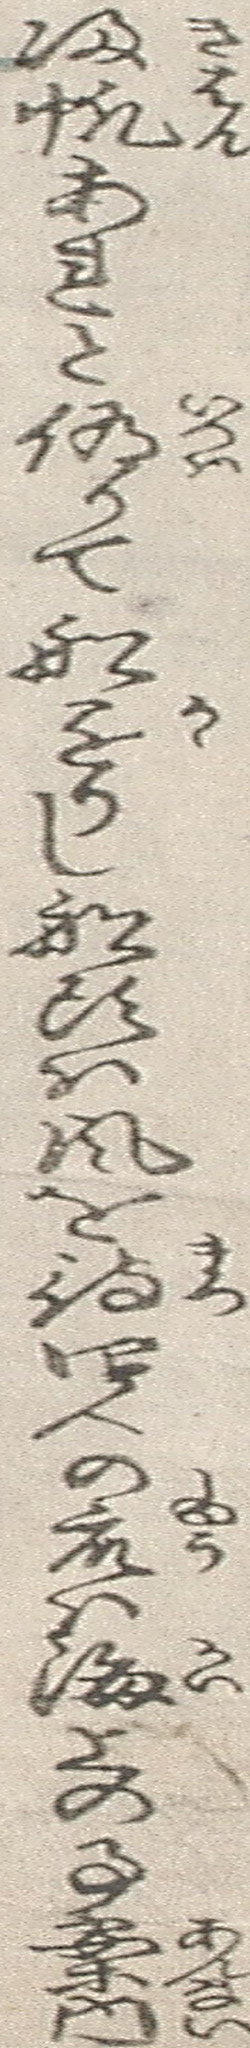帰帆あれと偽りて船懸りし船頭ハ風を待四人の衆ハ海上の事案内
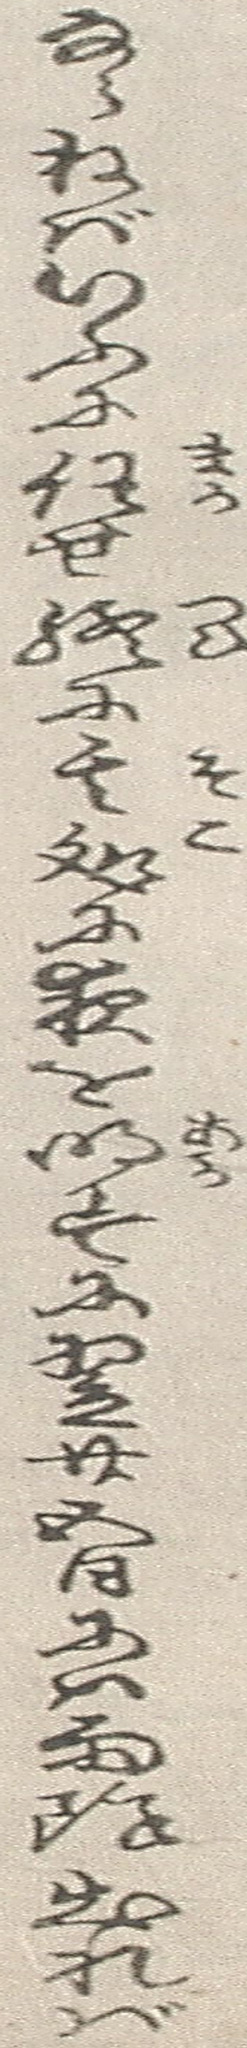ならねバいふに任せ終に其処に夜を明すに翌廿五日にハ雨降出れバ
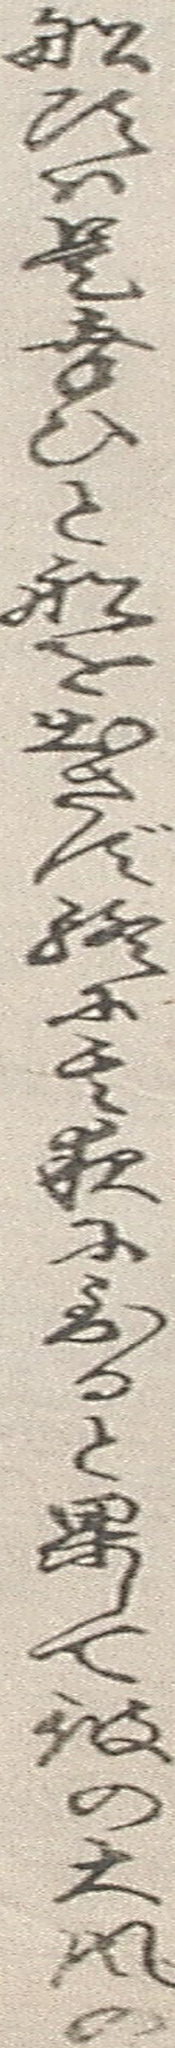船頭ハ是幸ひと船を出さず終に其夜に至ると果して彼の大風の
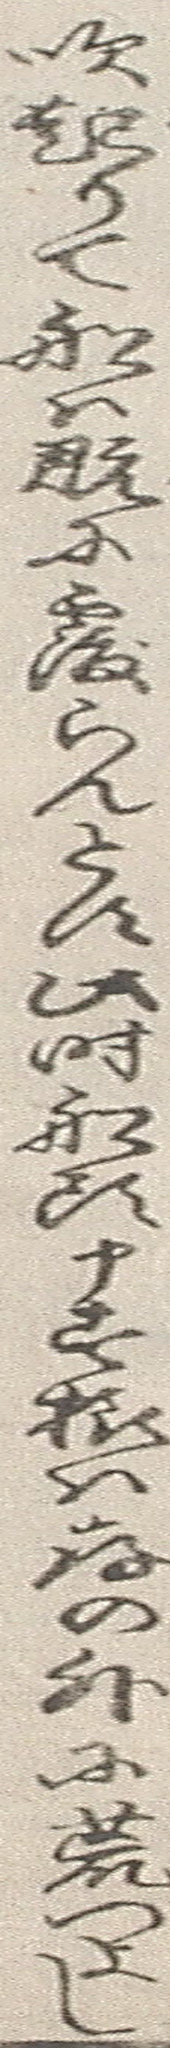吹起りて船ハ既に覆らんとす此時船頭申す様ハ存の外に荒つよし
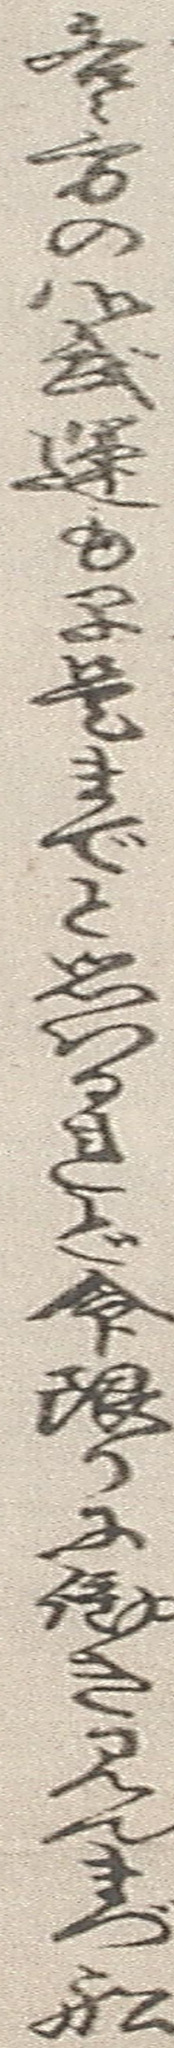各々方の御武運も早是までと思ハるれど命限りに働き見んまづ船
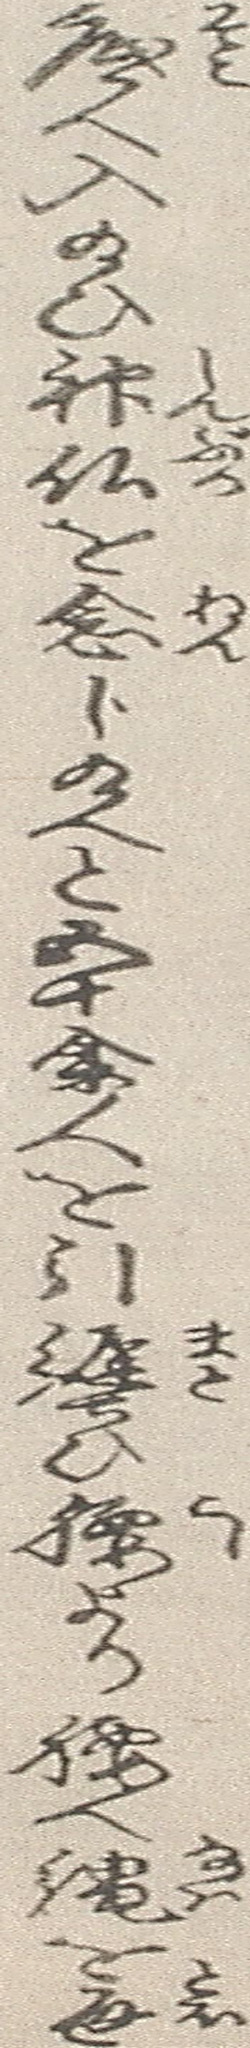底へ入給ひ神仏を念じ給へと五十余人を引纏ひ腰より腰へ縄を通
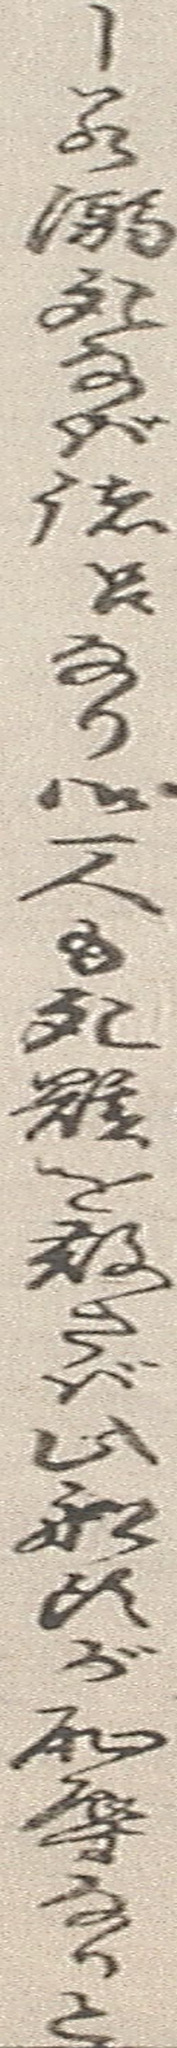し若溺死なバ諸共なり必一人も死骸を散さバ此船頭が恥辱なりと
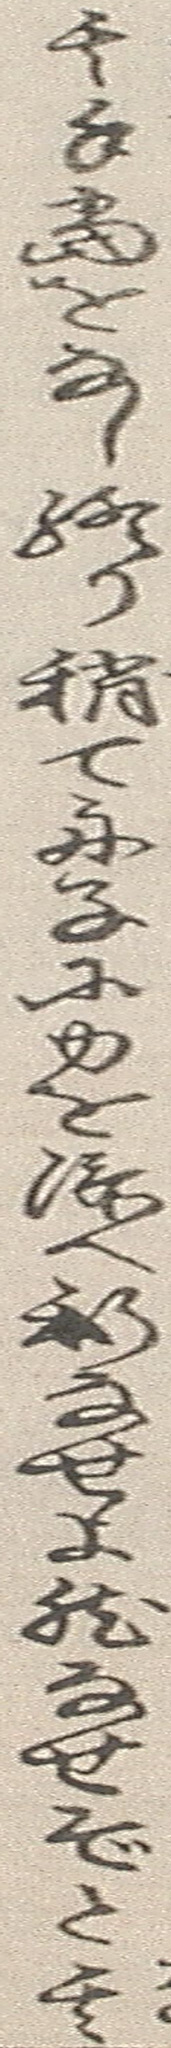其手当をなし終り稍て舟子に力を添へ斯なせよ然なせぞと其
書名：安政風聞集　上中下　全
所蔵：東京大学地震研究所図書室 Earthquake Research Institute Library, The University of Tokyo, JAPAN
